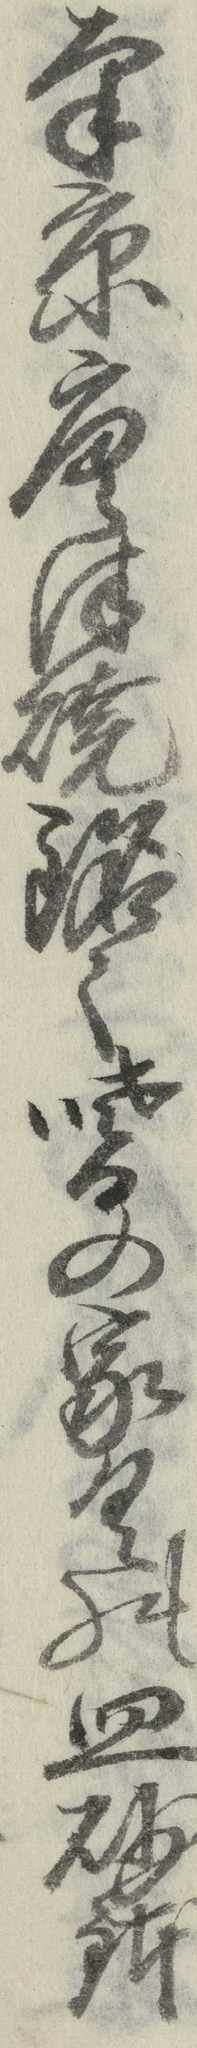南京唐津焼銘々その家々の皿砂鉢
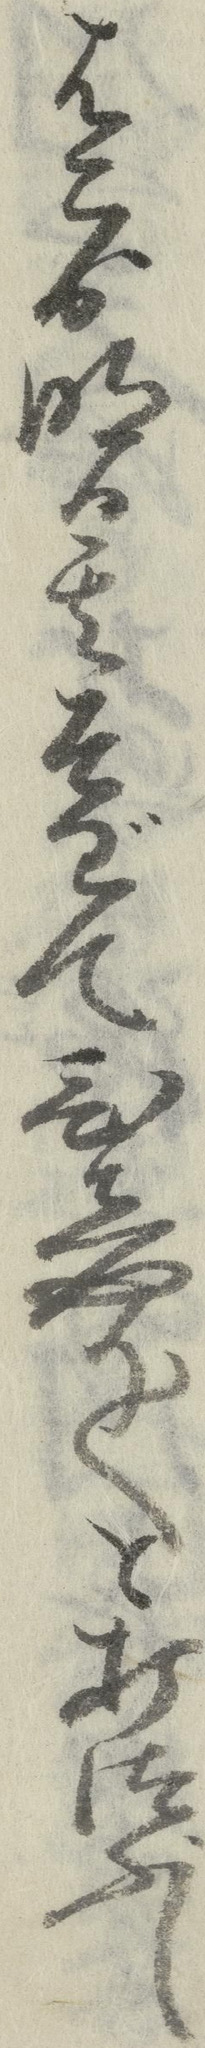はこゟ明る其そばてひしり〳〵と打つぶし

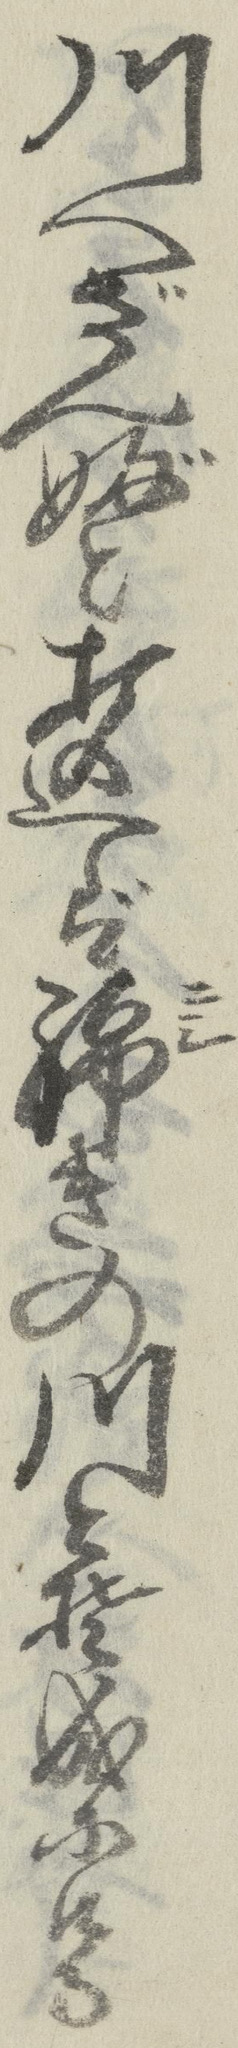川へざんぶと打込だ錦きの川とそ成にける
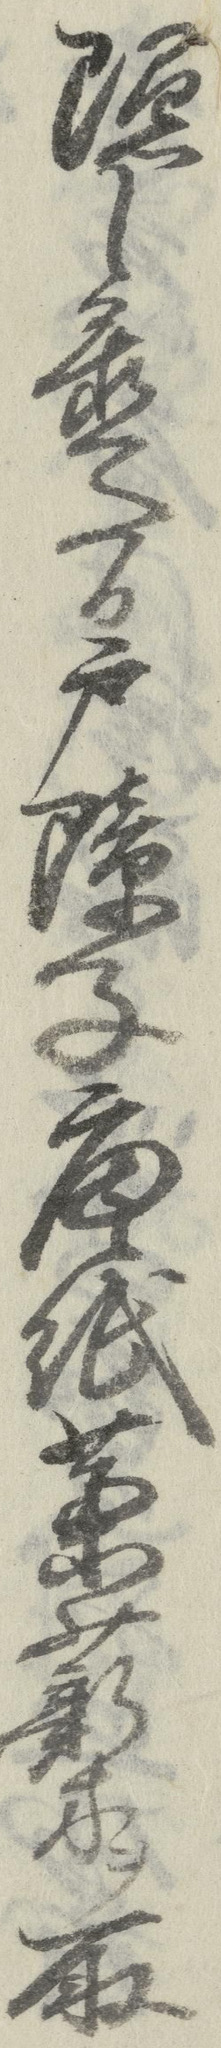隠し置きたる戸障子唐紙藁薪等ヲ取
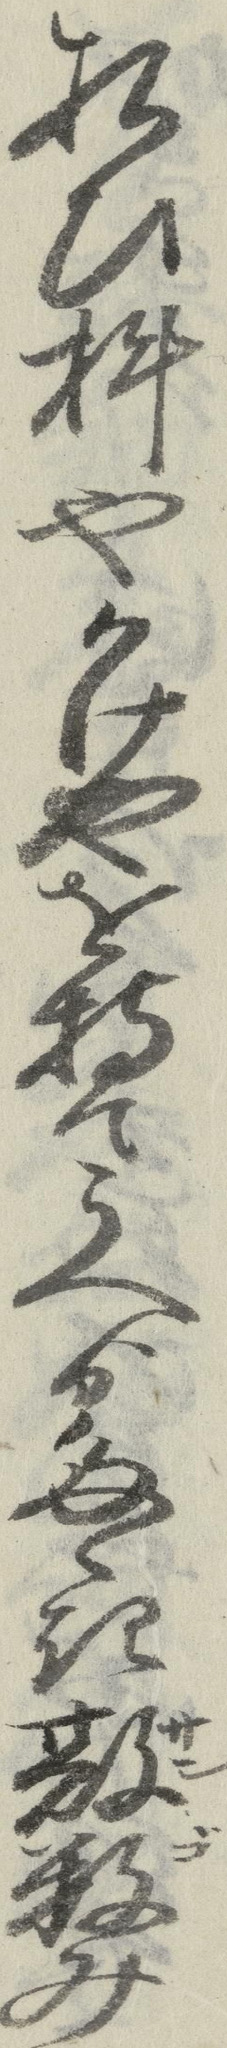払ひ枓やかけやを持てうへゟたゝき散數み
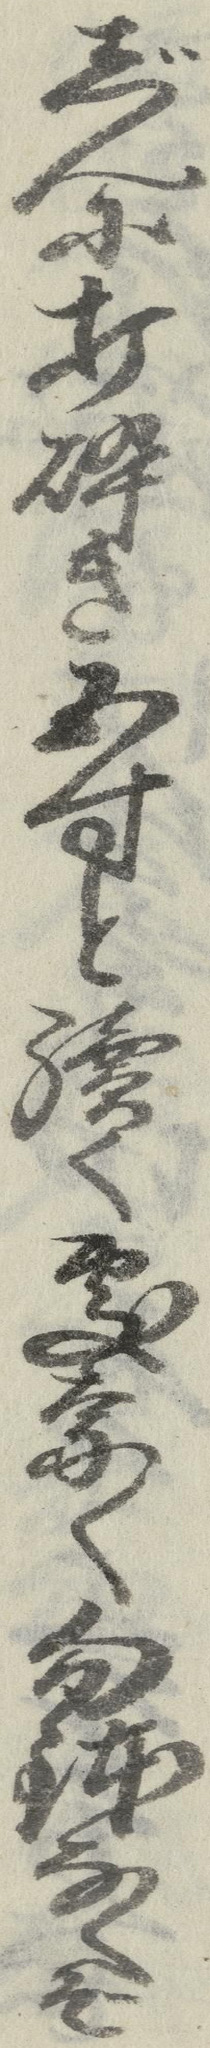じんに打砕き五寸と続く処なく忽躰なくぞ
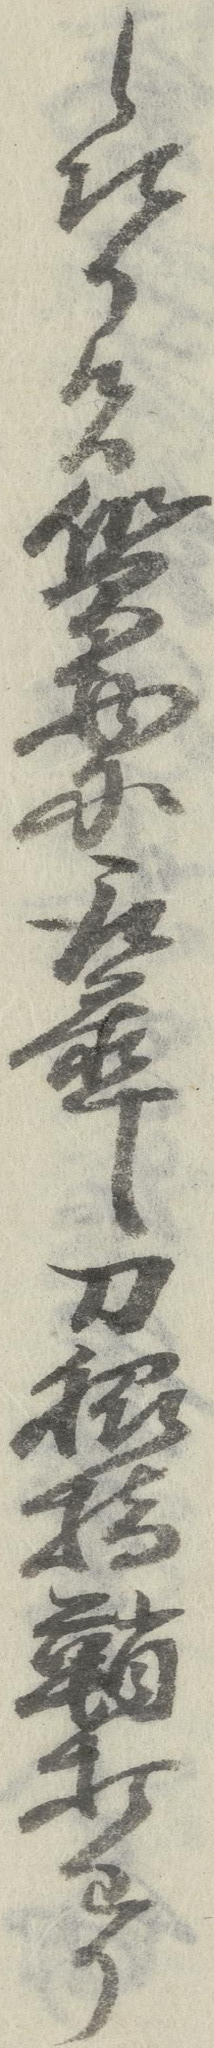したりける質物に取置し刀脇指鞘打わり
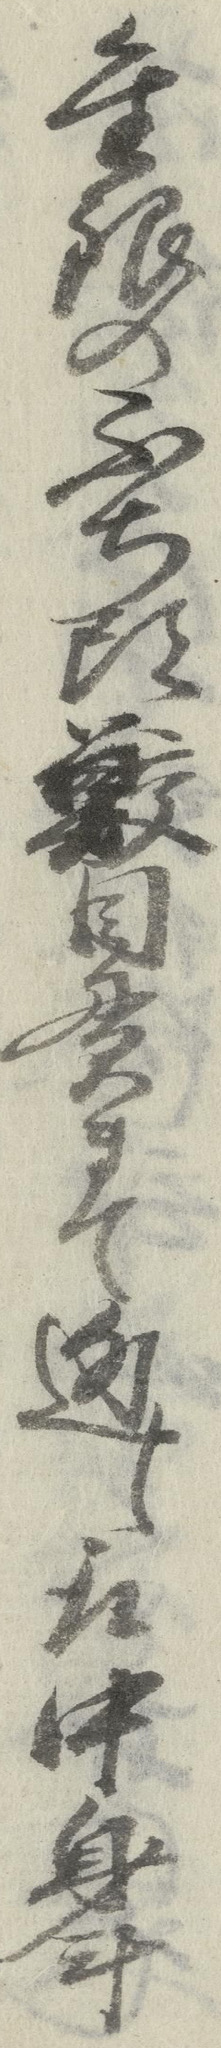金銀のふち頭鮫目貫まて迯し取中身計
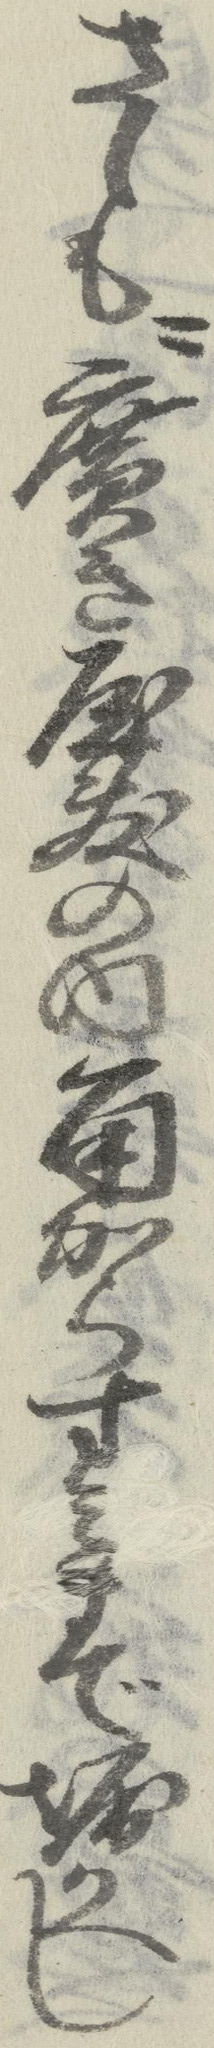さしもに廣き屋敷の内角からすみまで堀かへし
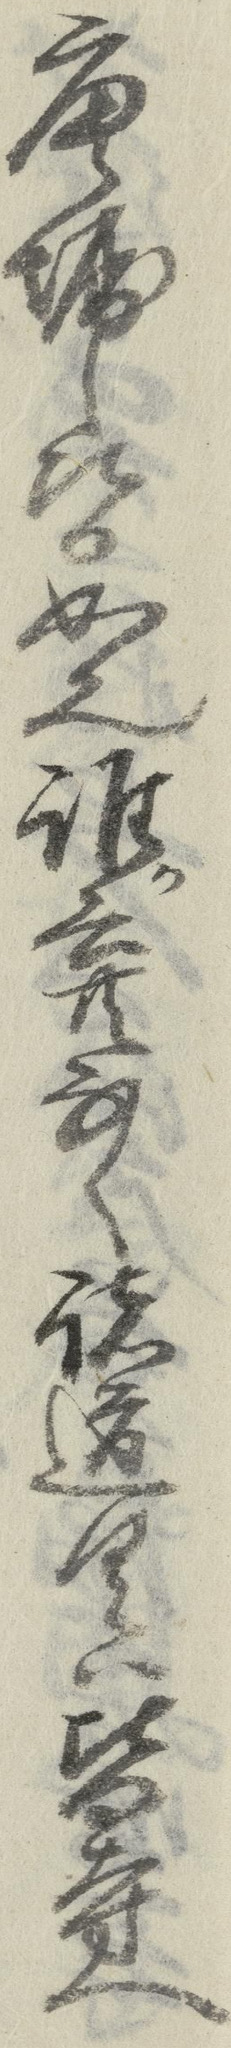唐堀したる如也誰云共なく諸道具は皆寺へ
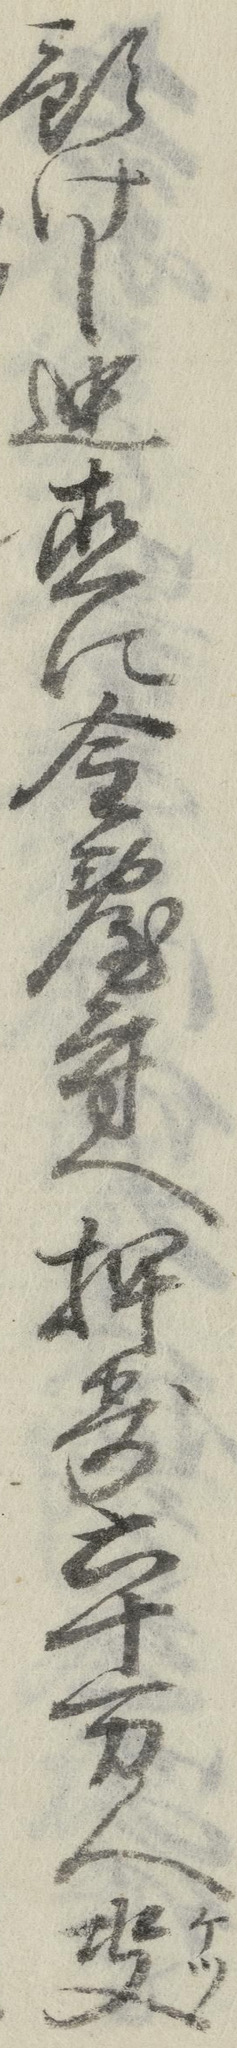預けし迚直に金臺寺へ押寄六十万人決
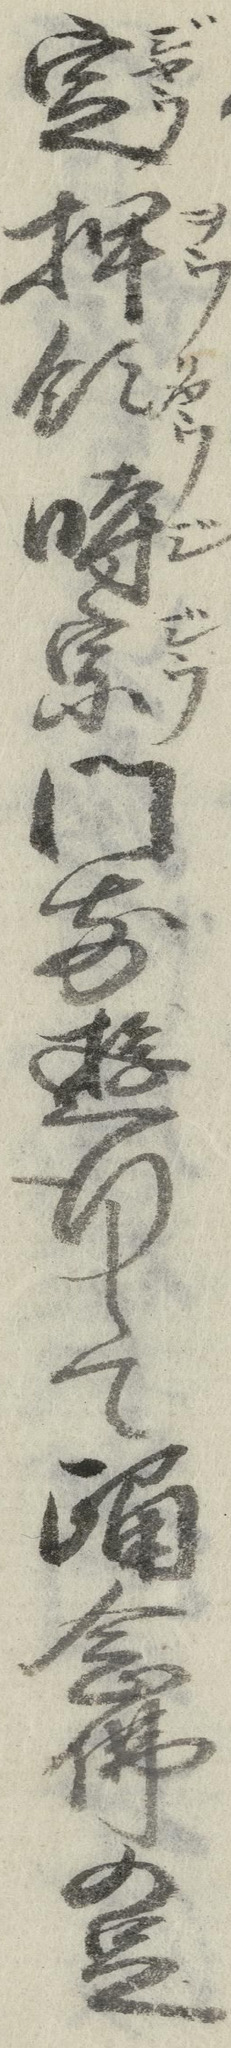定押領時宗門前遊行して踊念仏の足
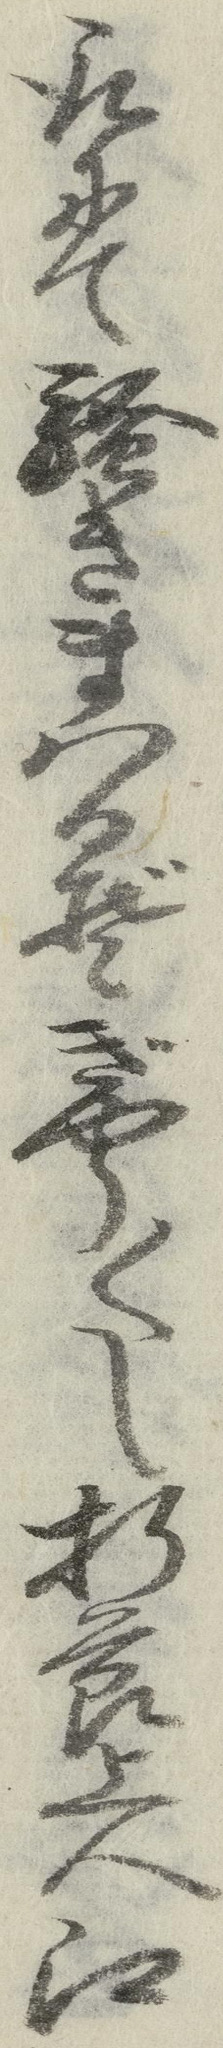取にて騒きまはるぞぎやう〳〵し打節上人江
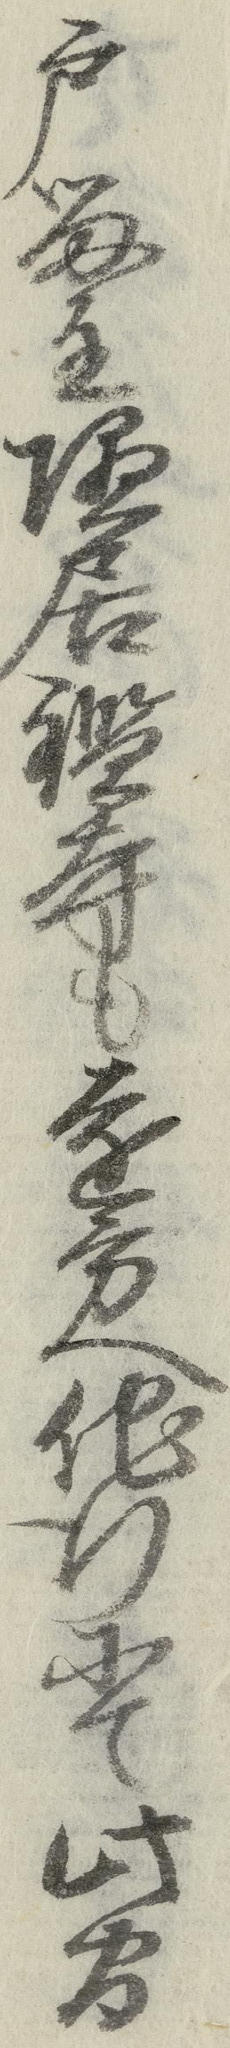戸留主隠居鑑寺も遠方へ他行にて此間
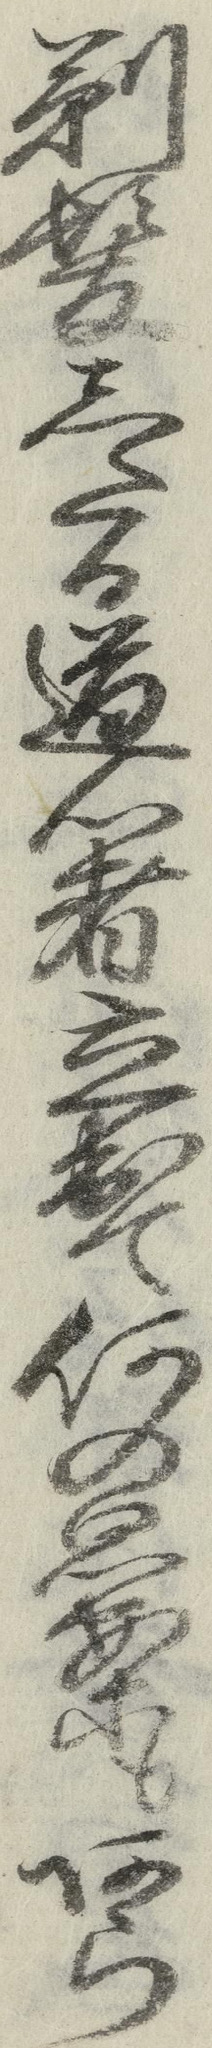剃髪したる道心者立出て何の思案もあら
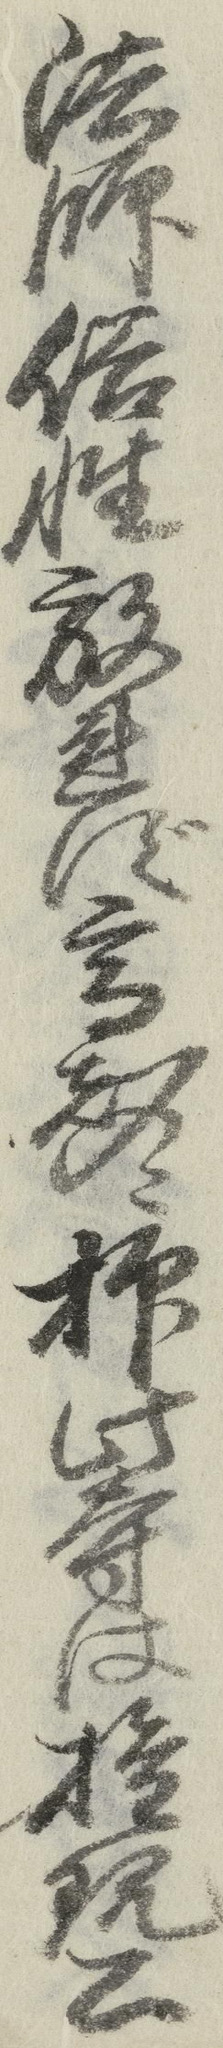法師俗性放れず高声に抑此寺は権現公
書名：浅間大焼騒動記　中
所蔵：東京大学地震研究所図書室 Earthquake Research Institute Library, The University of Tokyo, JAPAN
